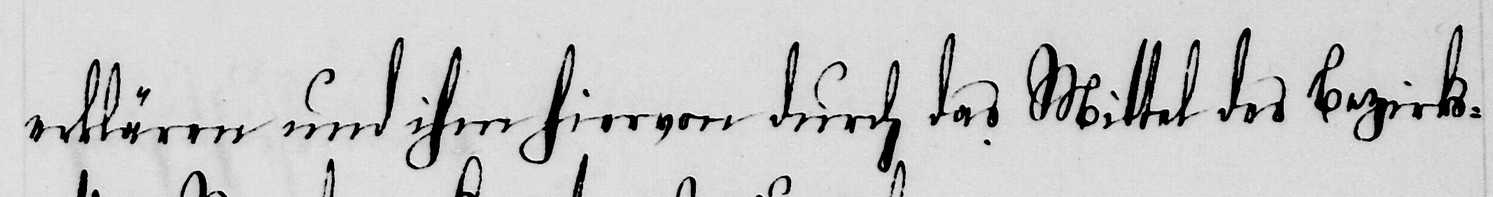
erklären und ihm hiervon durch das Mittel des Bezirks¬
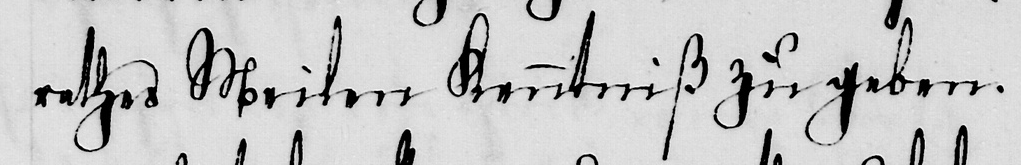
rathes Meilen Kenntniß zu geben.
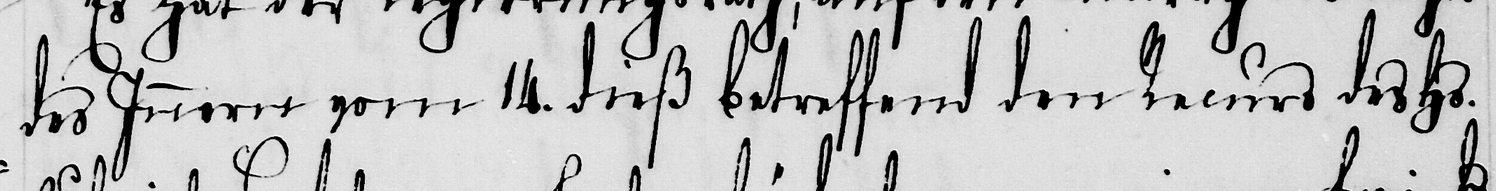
des Innern vom 14. dieß betreffend den Recurs des Hs.
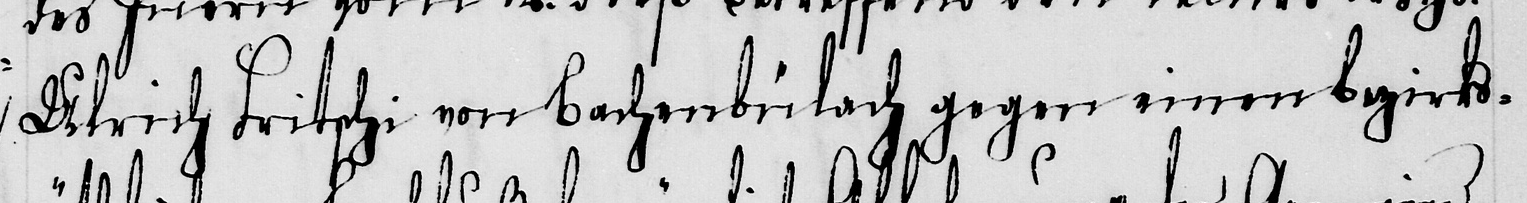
Ulrich Fritschi von Bachenbülach gegen einen bezirks¬
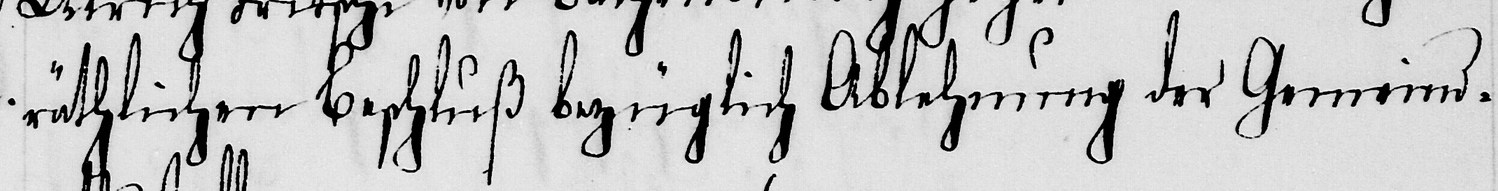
räthlichen Beschluß bezüglich Ablehnung der Gemeind¬
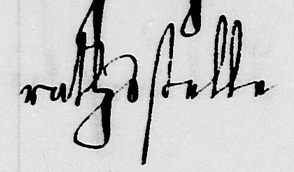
rathsstelle
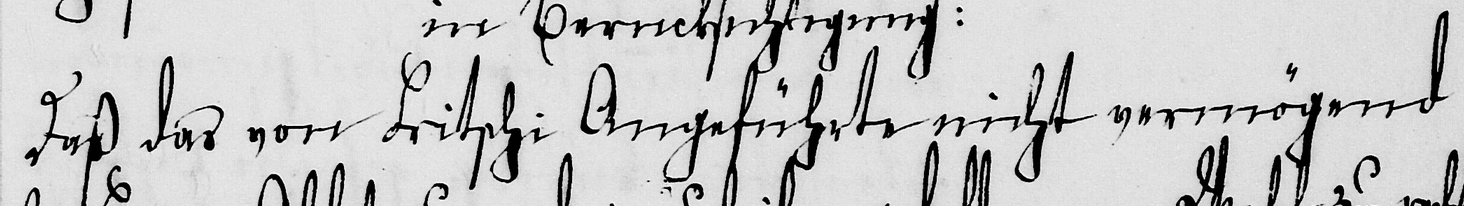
Daß das von Fritschi Angeführte nicht vermögend
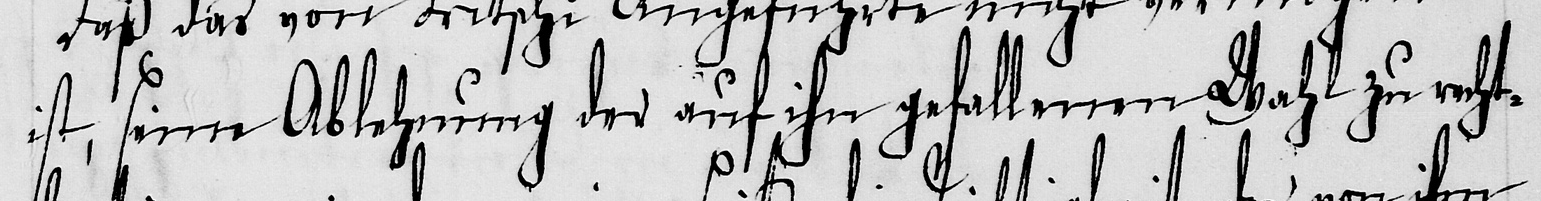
ist, seine Ablehnung der auf ihn gefallenen Wahl zu recht¬
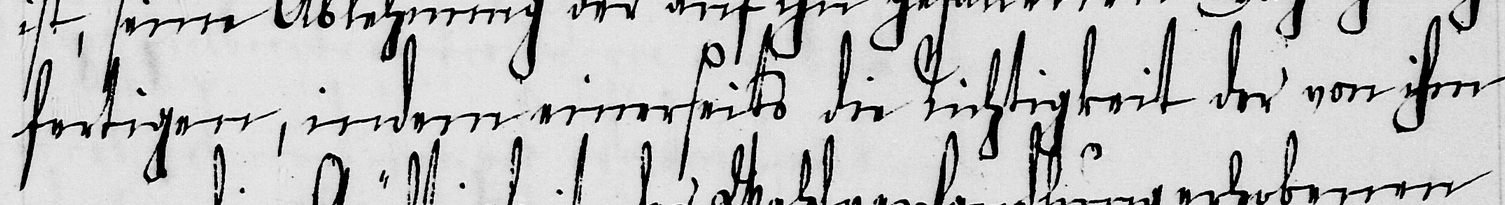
fertigen, indem einerseits die Richtigkeit der von ihm
